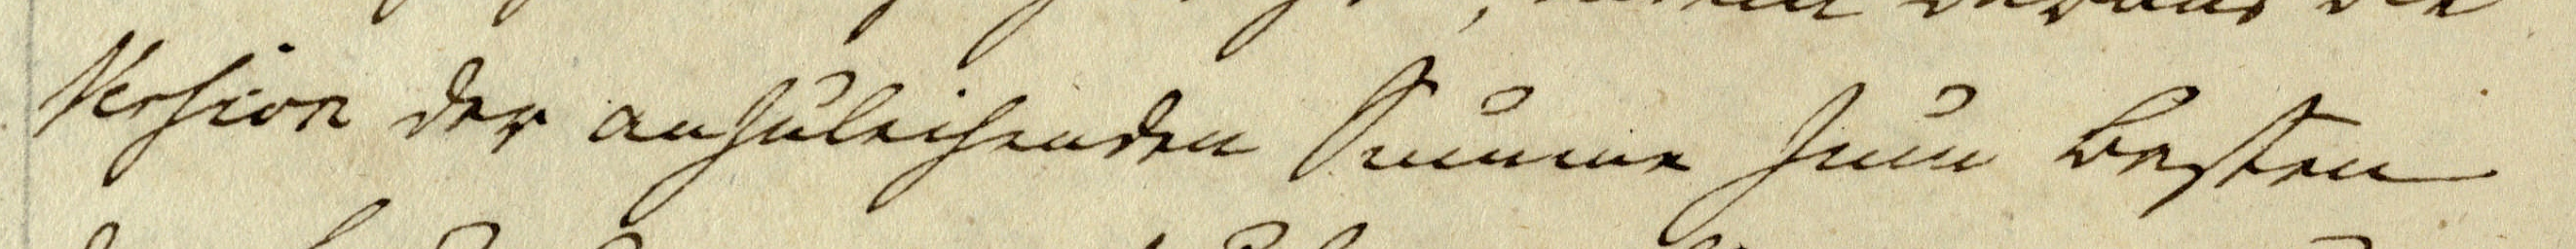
Version der anzuleihenden Summe zum Besten
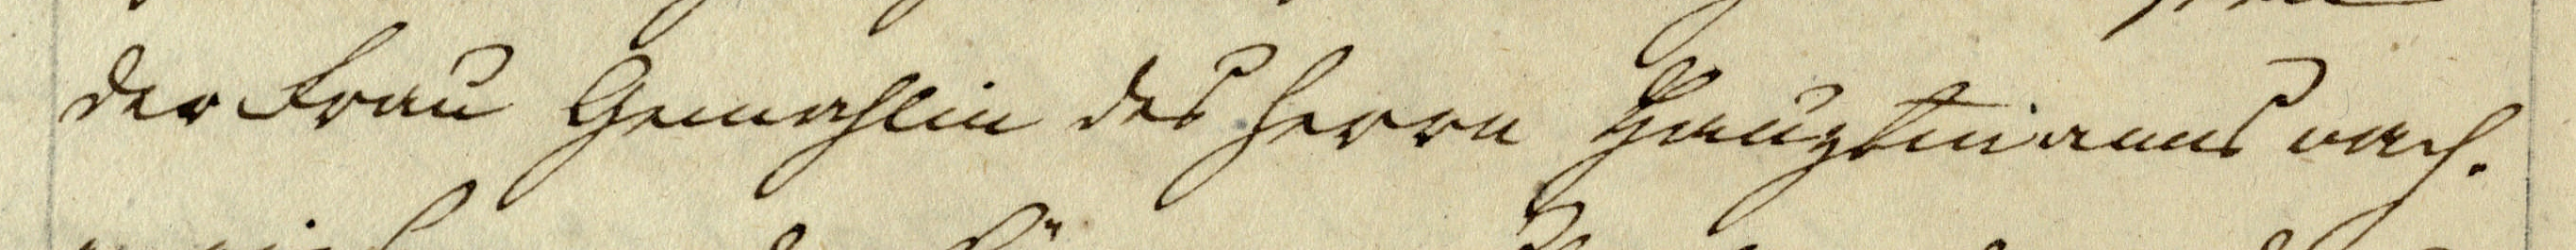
der Frau Gemahlin des Herrn Hauptmanns nach
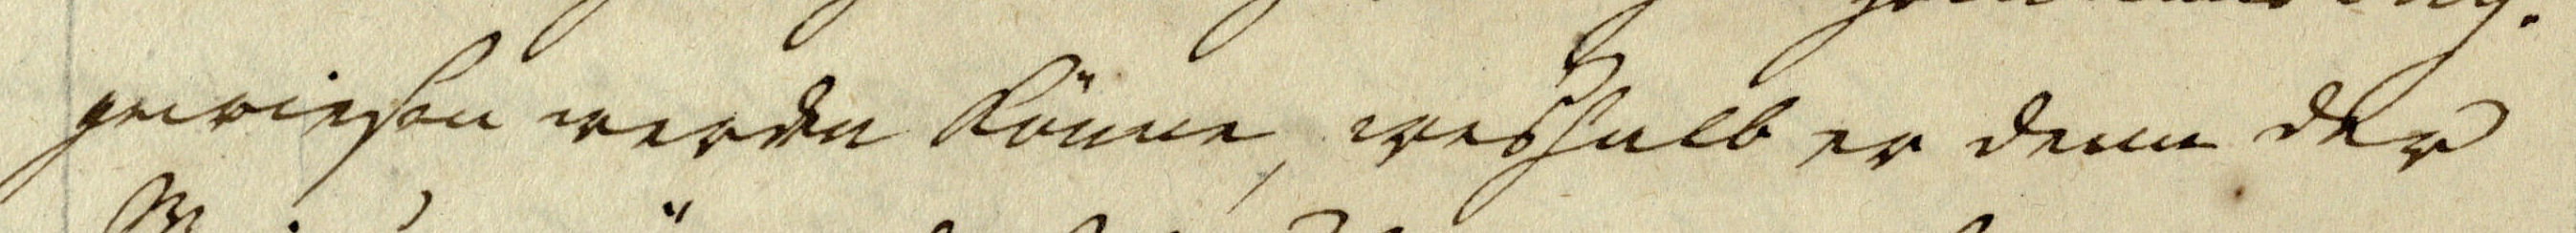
gewiesen werden könne, weshalb er denn der
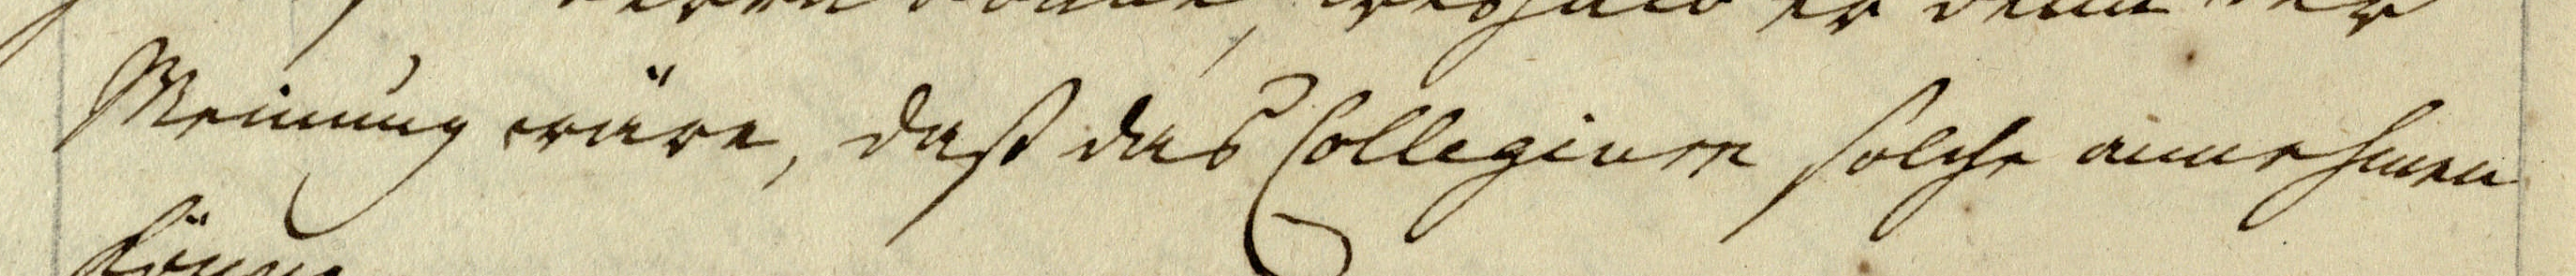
Meinung wäre, daß das Collegium solche annehmen
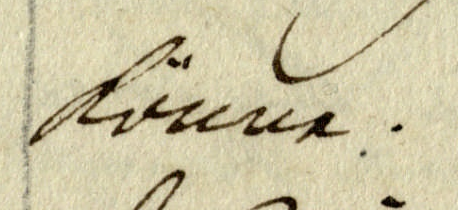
könne.
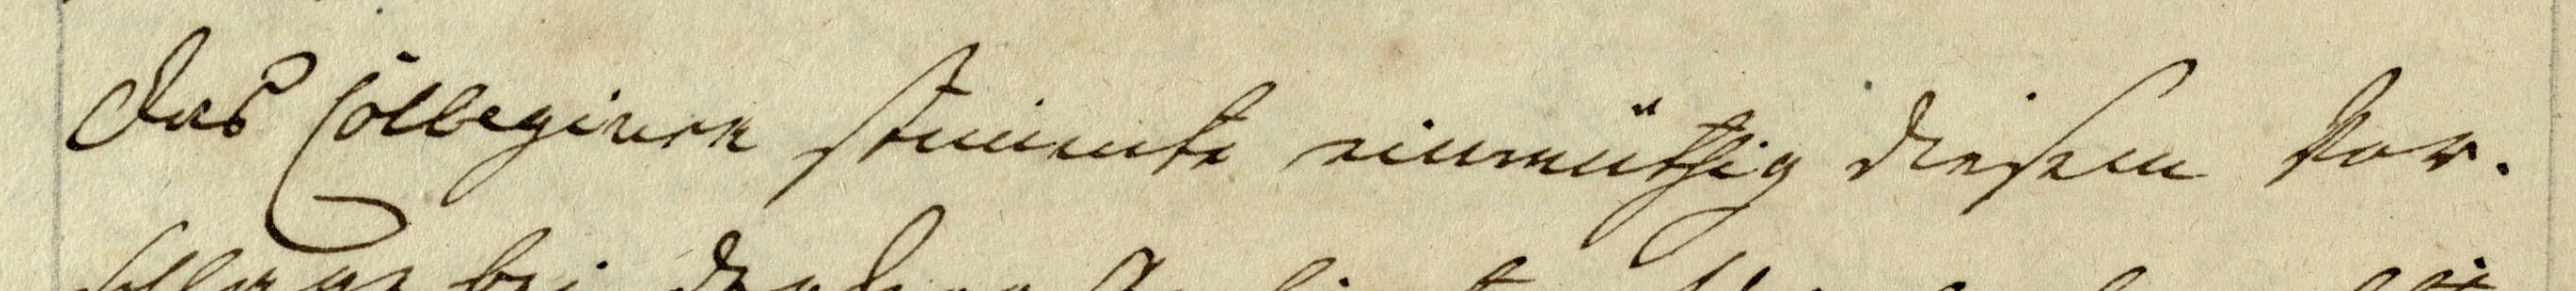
Das Collegium stimmte einmüthig diesem Vor¬
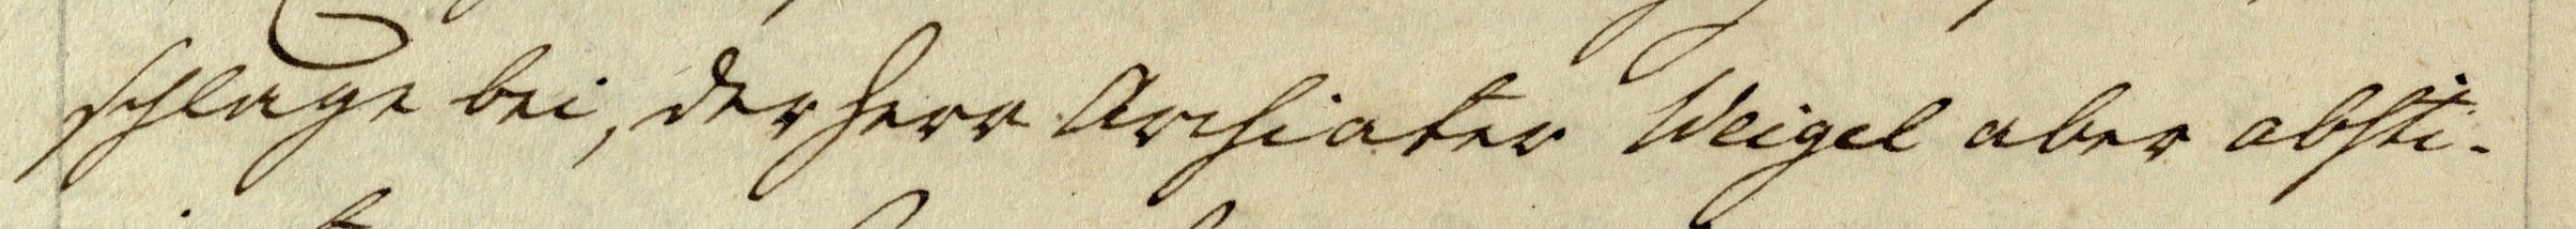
schlage bei, der Herr Archiater Weigel aber absti¬
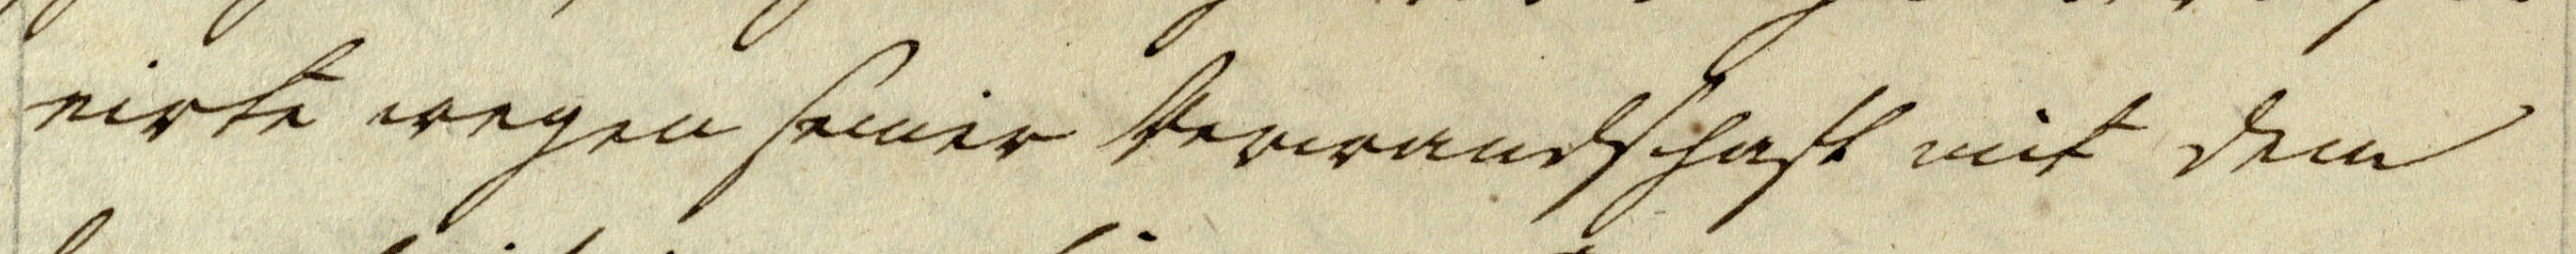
nirte wegen seiner Verwandschaft mit dem
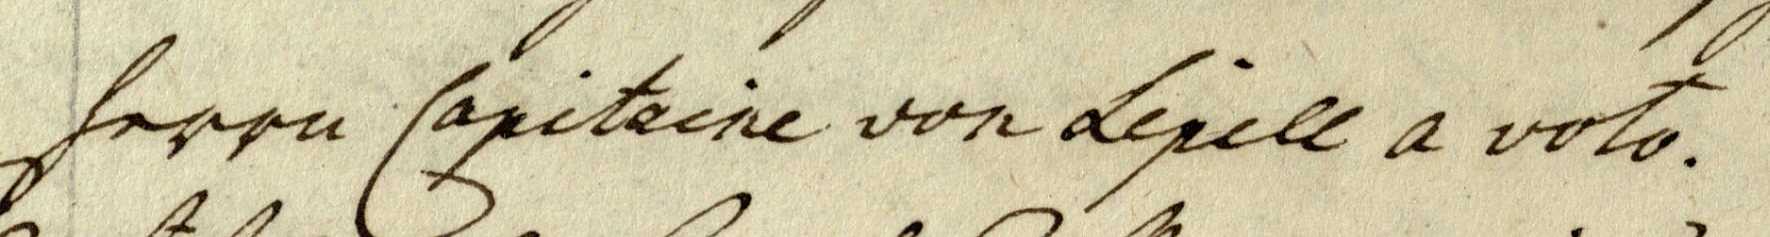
Herrn Capitaine von Lepell a voto.
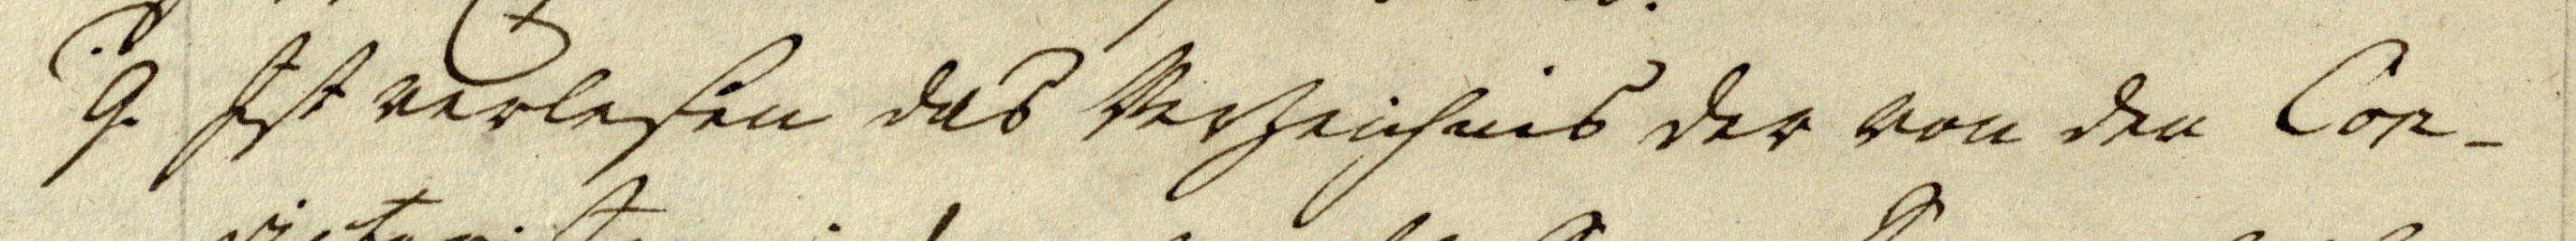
9. Ist verlesen das Verzeichnis der von den Con¬
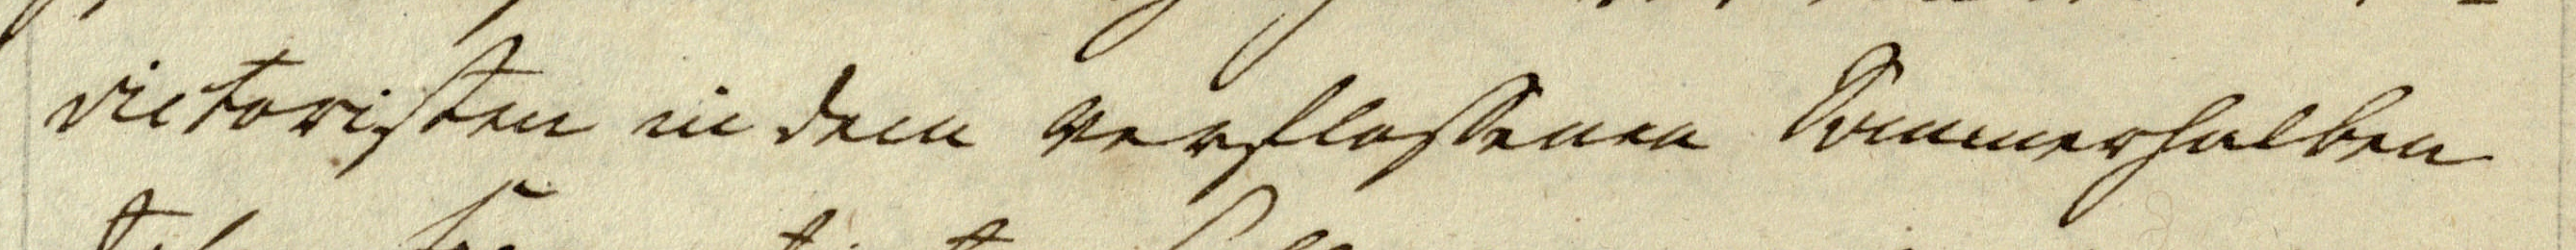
victoristen in dem verflossenen Sommerhalben
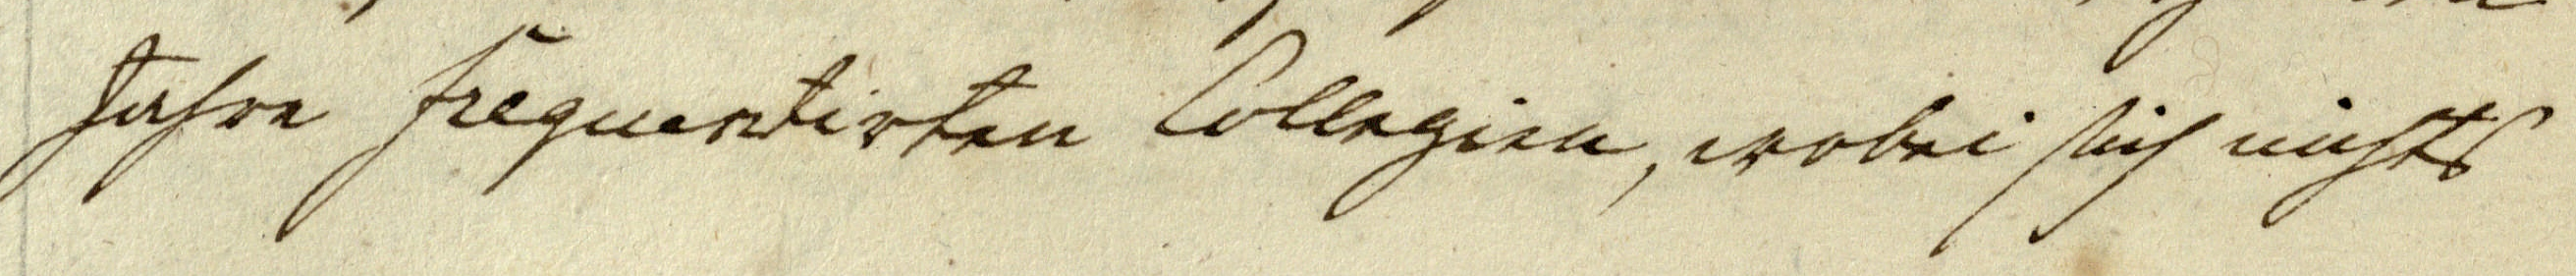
Jahre frequentirten Collegien, wobei sich nichts
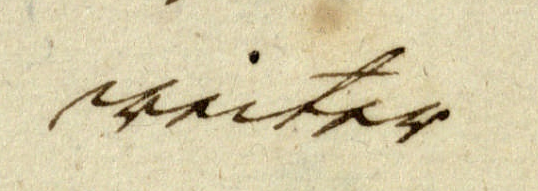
weiter
